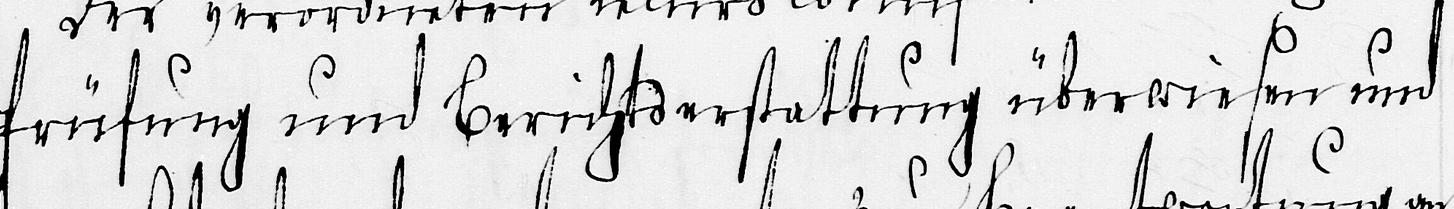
Prüfung und Berichtserstattung überwiesen und
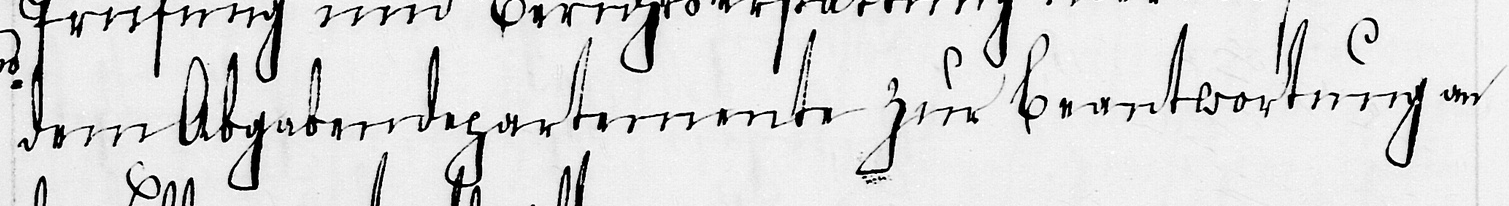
dem Abgabendepartemente zur Beantwortung an
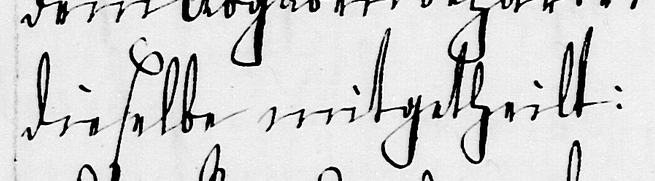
dieselbe mitgetheilt:
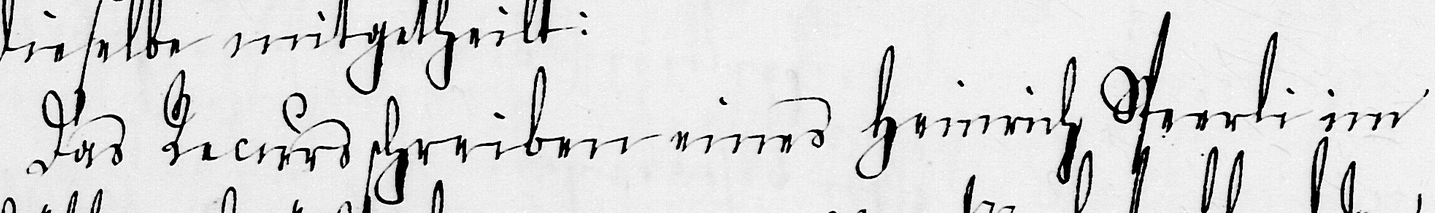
Das Recursschreiben eines Heinrich Speerli im
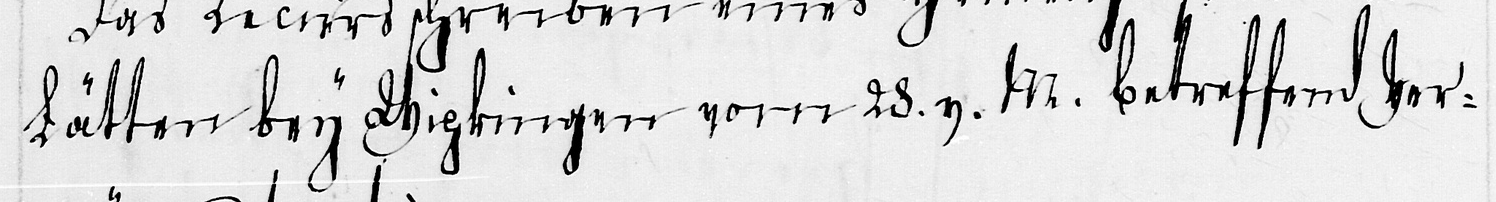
Lätten bey Wipkingen vom 28. v. M. betreffend Ver¬
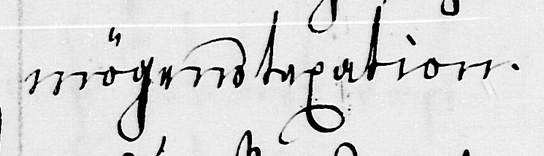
mögenstaxation.
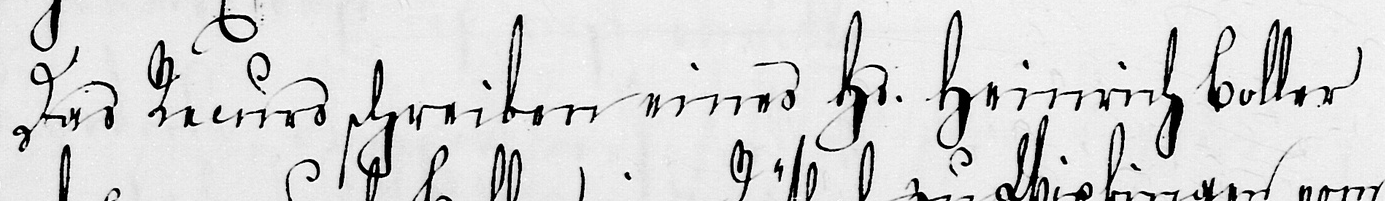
Das Recursschreiben eines Hs. Heinrich Boller
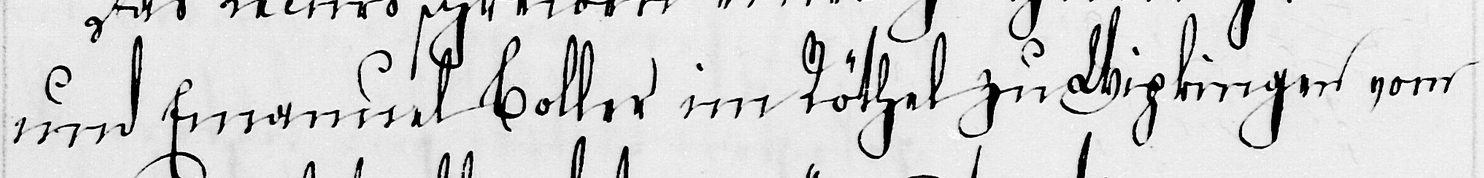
und Emanuel Boller im Röthel zu Wipkingen vom
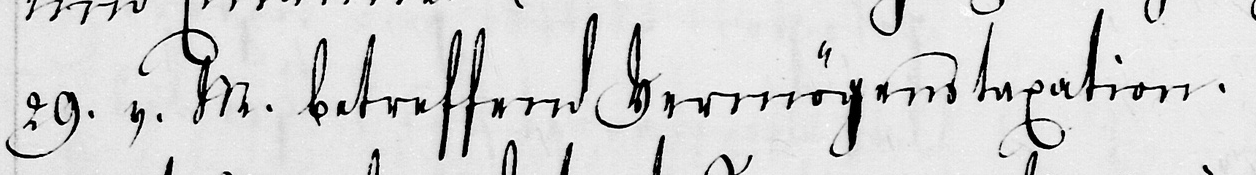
29 v. M. betreffend Vermögenstaxation.
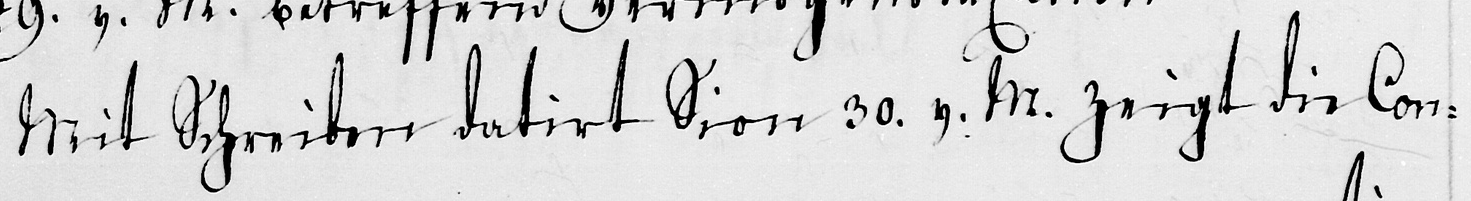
Mit Schreiben datirt Sion 30. v. M. zeigt die Con-
